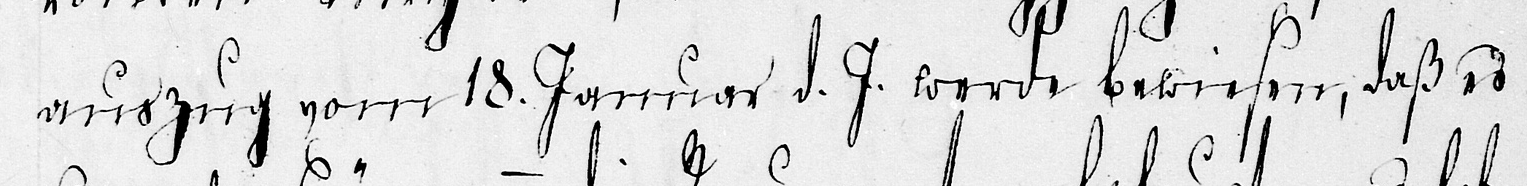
sauszug vom 18. Januar d. J. werde bewiesen, daß es
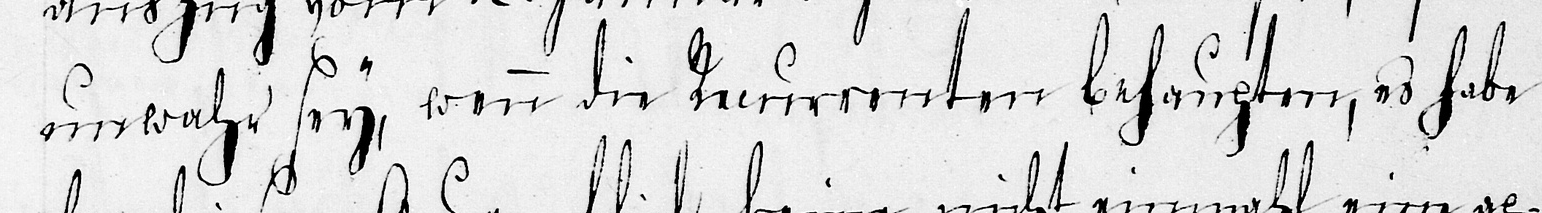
unwahr sey, wenn die Recurrenten behaupten, es habe
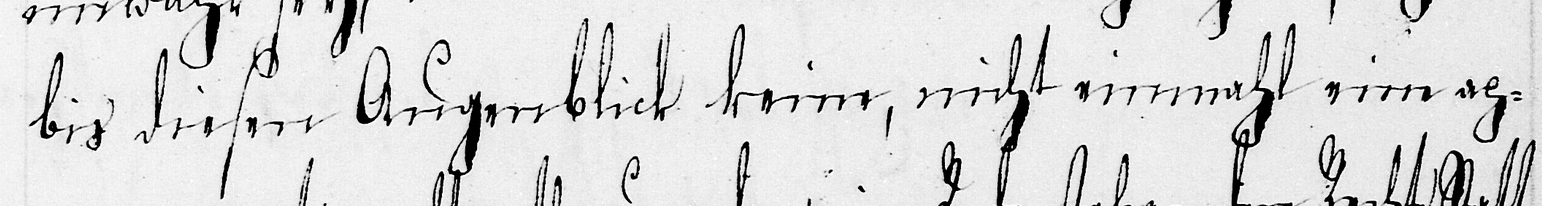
bis diesen Augenblick keine, nicht einmahl eine ap¬
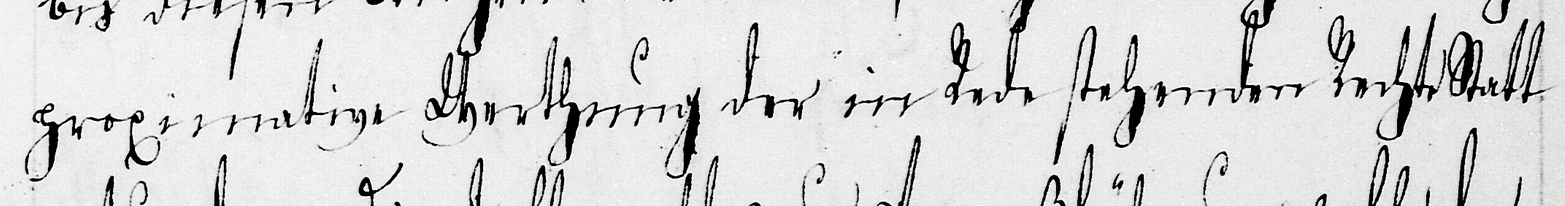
proximative Werthung der in Rede stehenden Rechte Statt
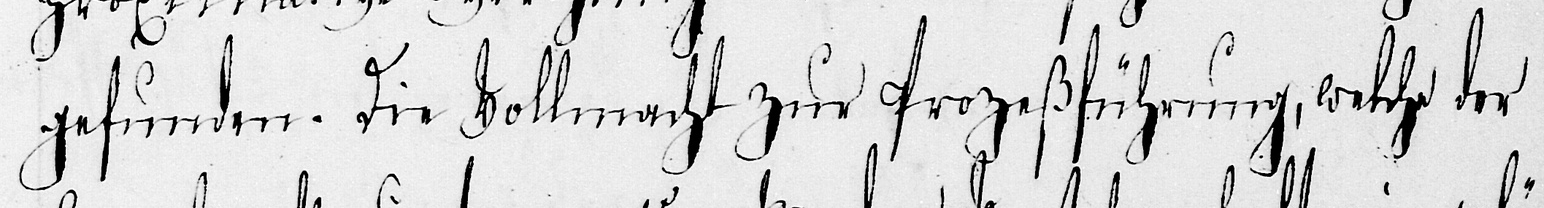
gefunden. Die Vollmacht zur Prozeßführung, welche der
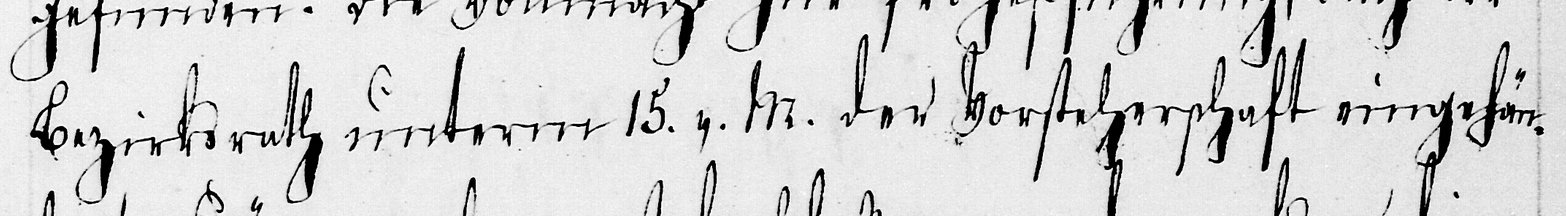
Bezirksrath unterm 15. v. M. der Vorsteherschaft eingehän¬
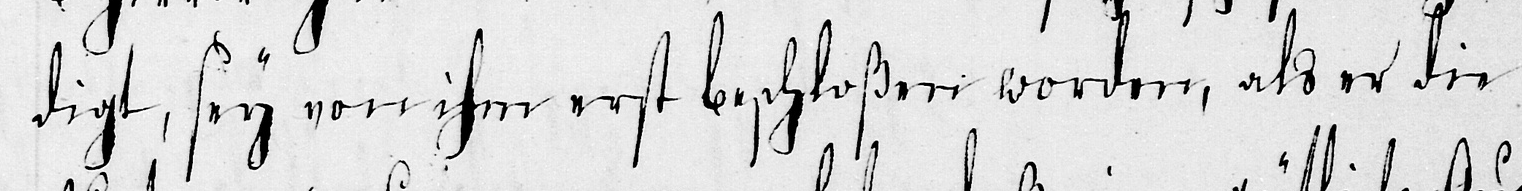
digt, sey von ihm erst beschloßen worden, als er die
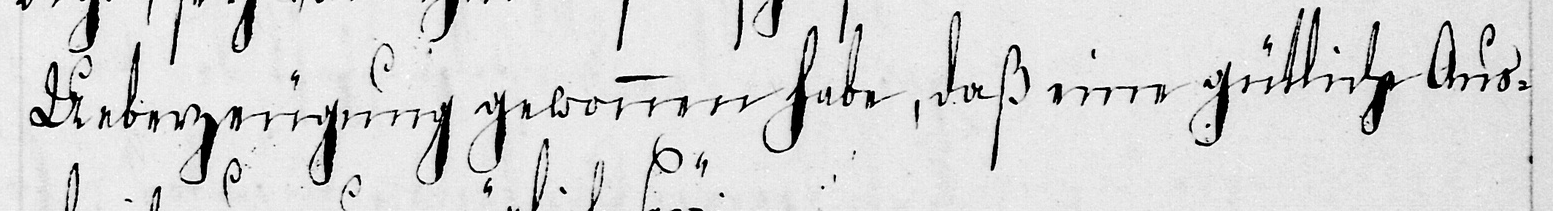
Ueberzeugung gewonnen habe, daß eine gütliche Aus¬
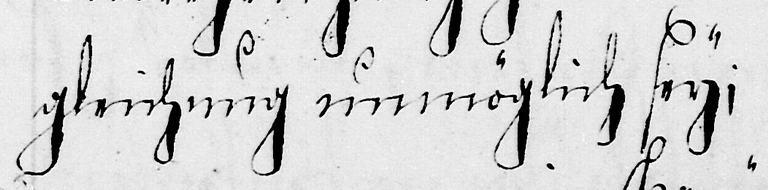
gleichung unmöglich sey;
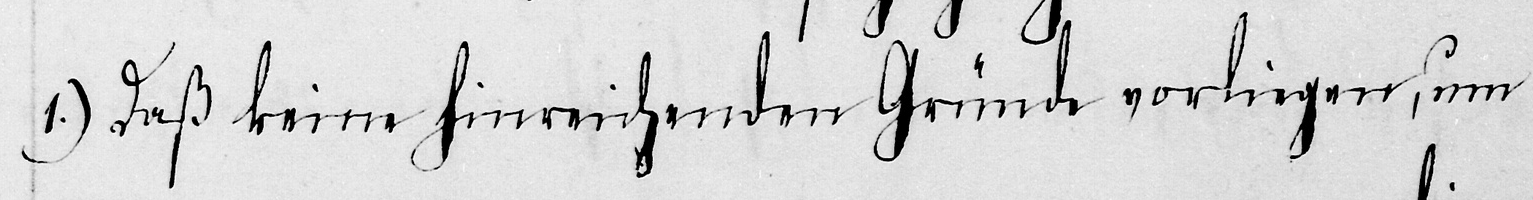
1.) Daß keine hinreichenden Gründe vorliegen, um
